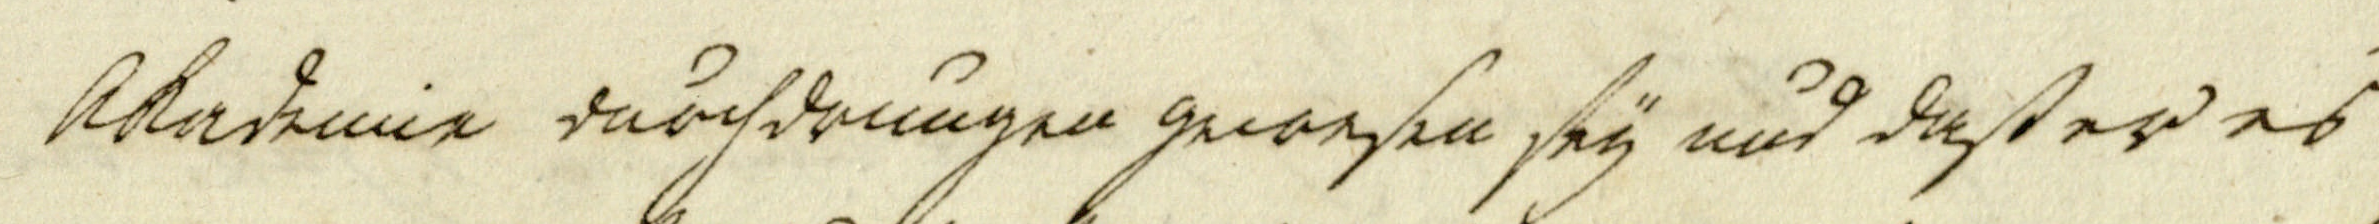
Akademie durchdrungen gewesen seÿ und daß er es
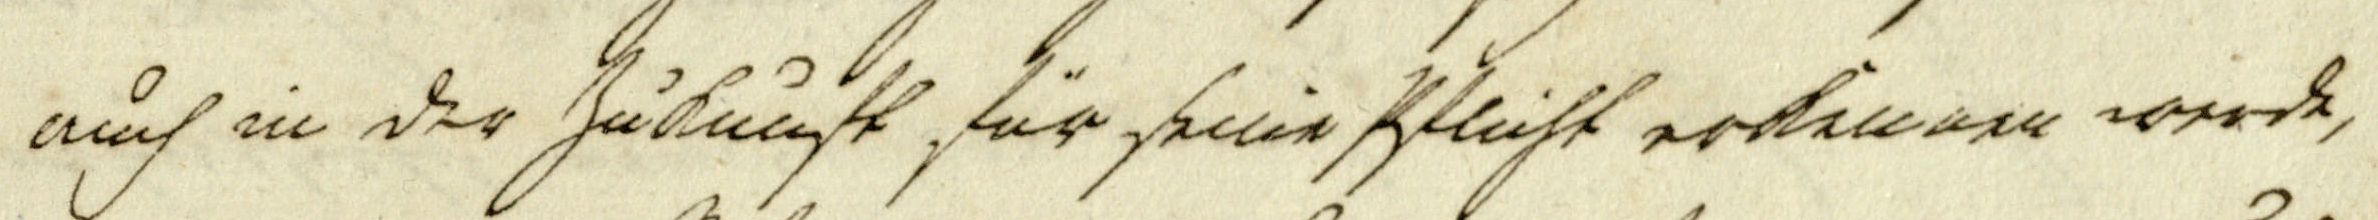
auch in der Zukunft für seine Pflicht erkennen werde,
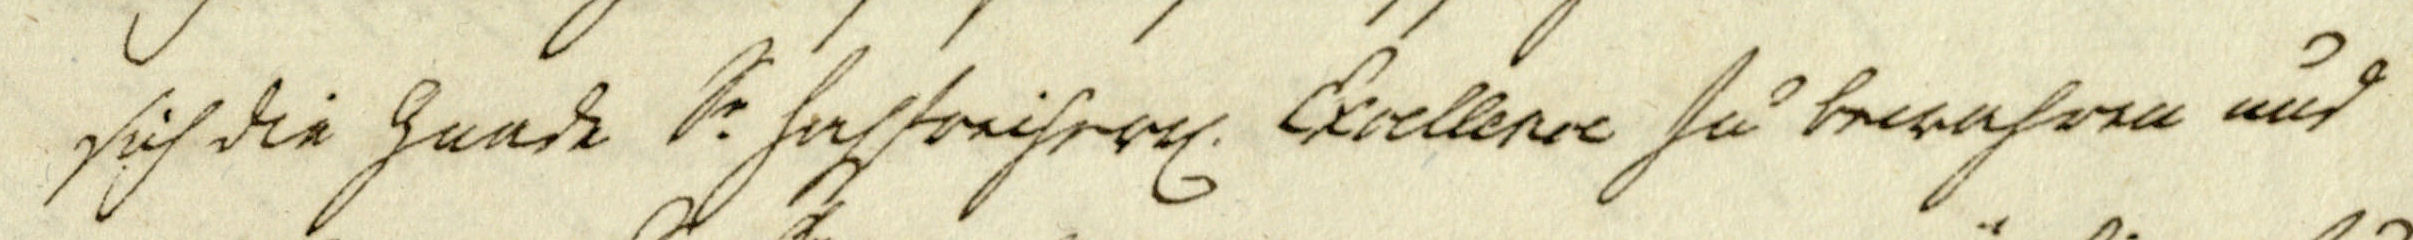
sich die Gnade Sr. Hochfreiherrl. Excellence zu bewahren und
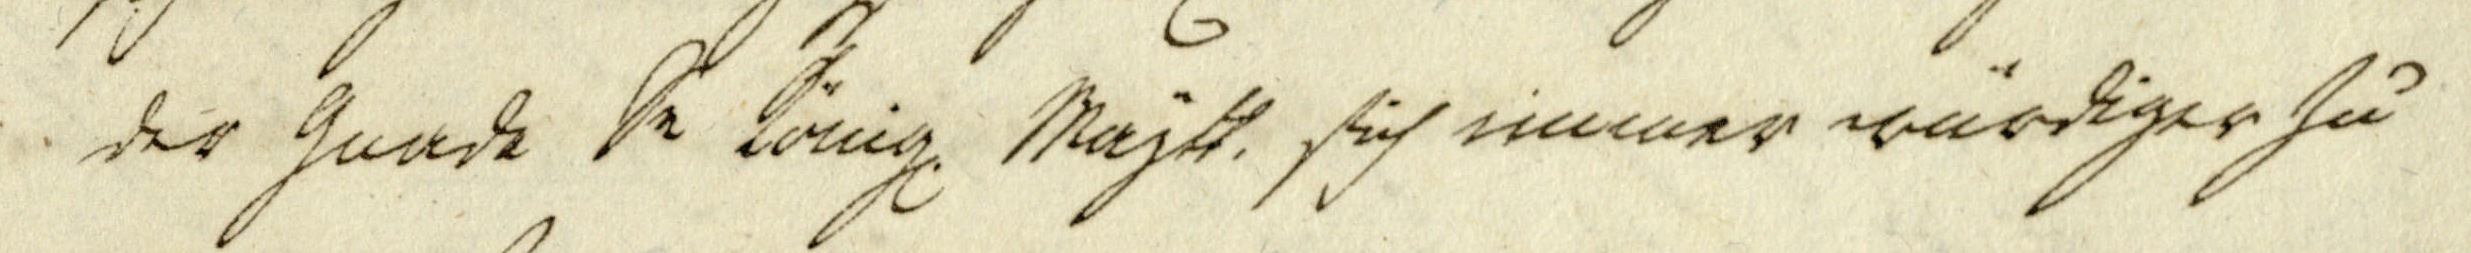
der Gnade Sr. Königl. Maÿtt. sich immer würdiger zu
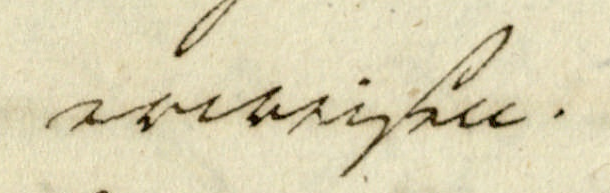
erweisen.
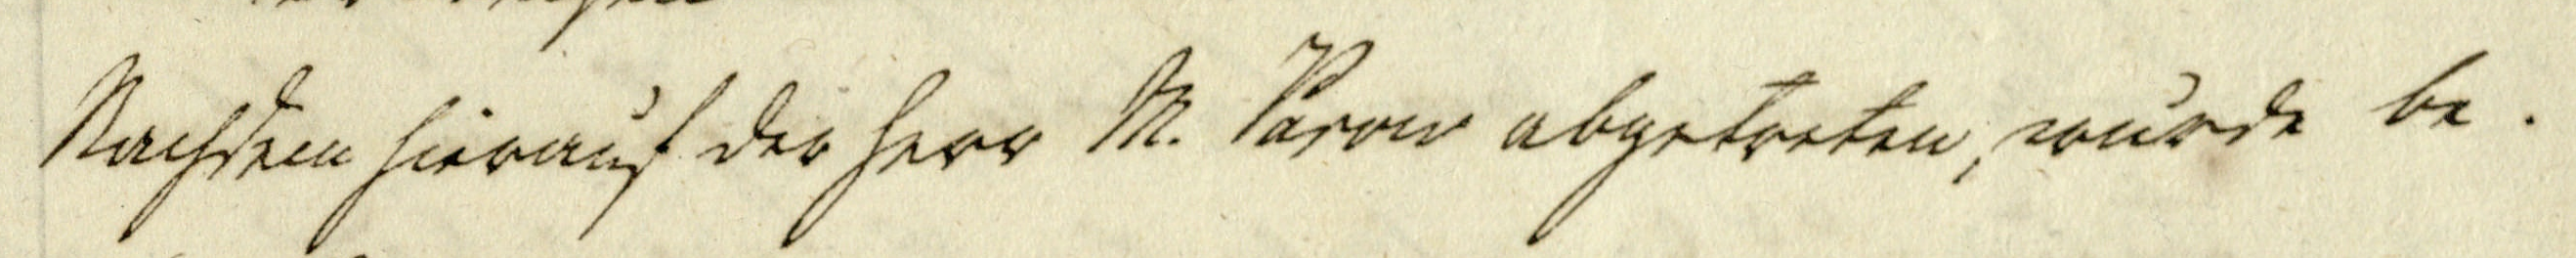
Nachdem hierauf der herr M. Parow abgetreten, wurde be¬
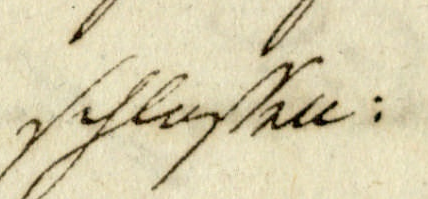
schlossen:
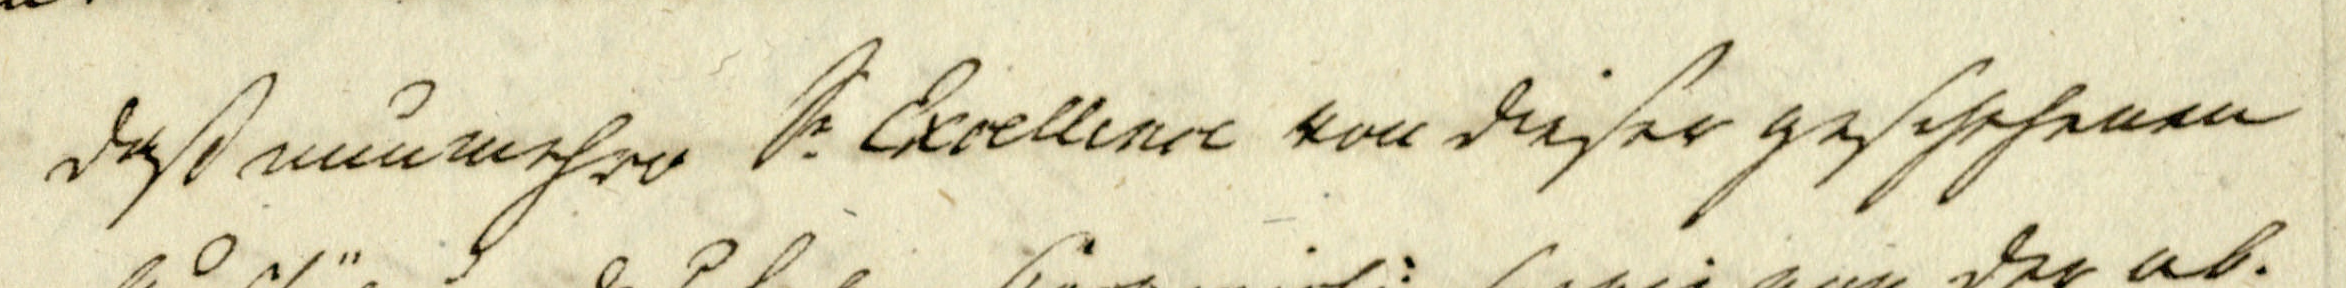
daß nunmehro Sr. Excellence von dieser geschehenen
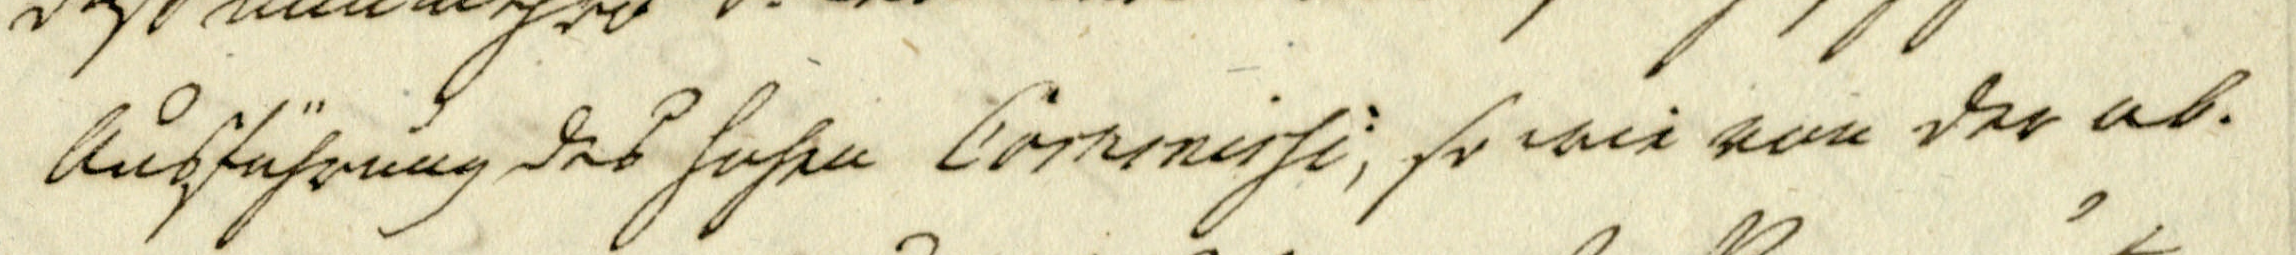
Ausführung das hohe Commissi, so wie von der ab¬
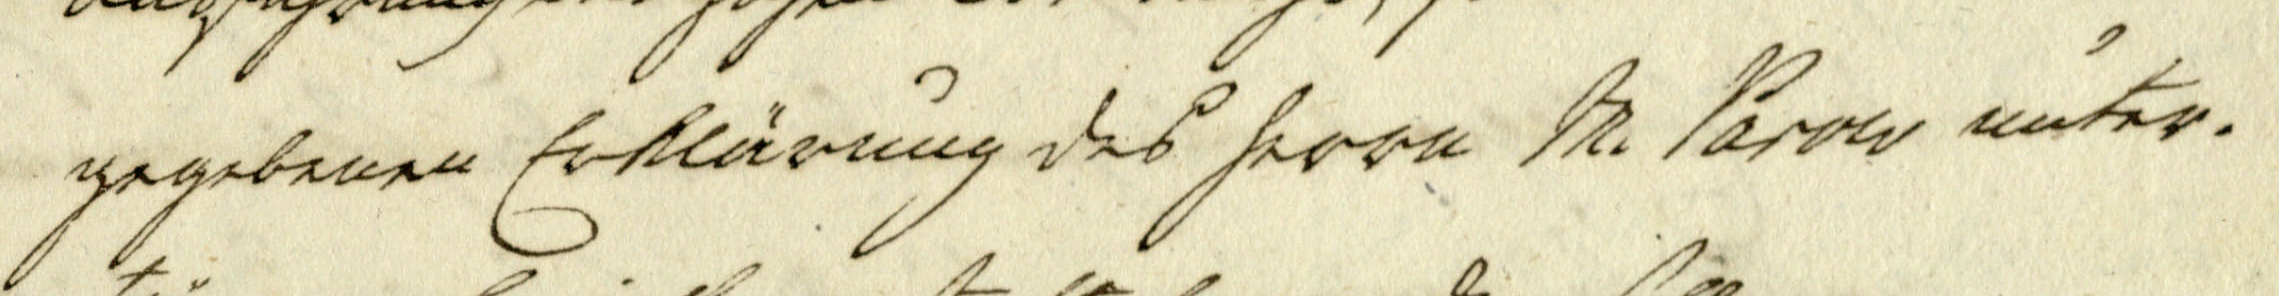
gegebenen Erklärung des herrn M. Parow unter¬
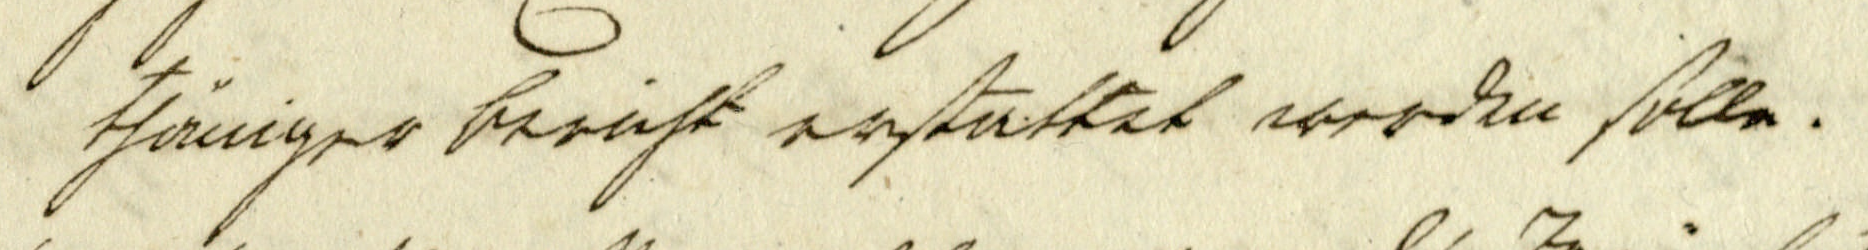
thäniger Bericht erstattet werden solle.
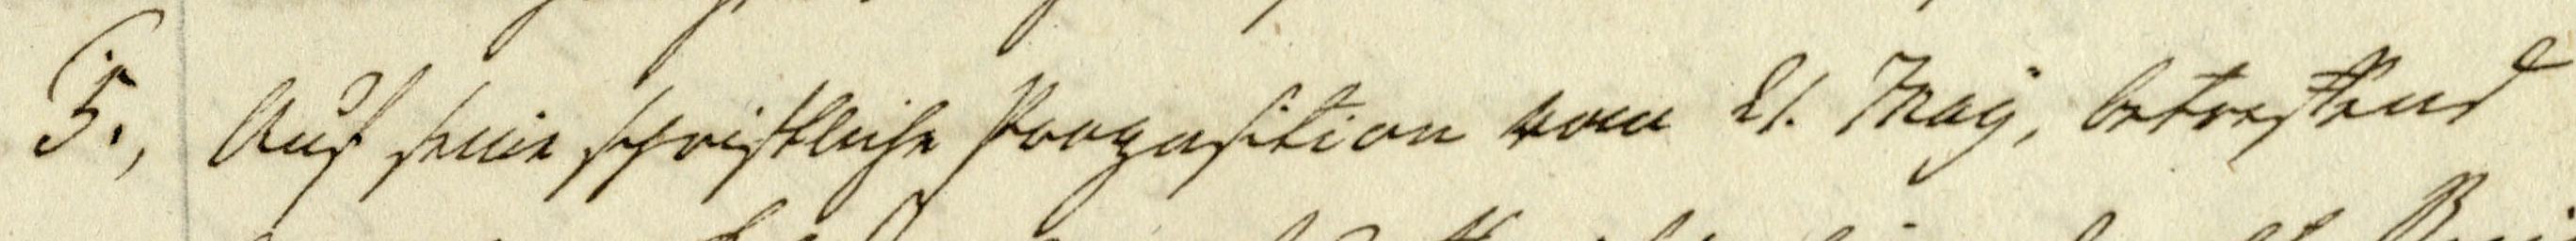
5., Auf seine schriftliche Proposition vom 21. Maÿ, betreffend
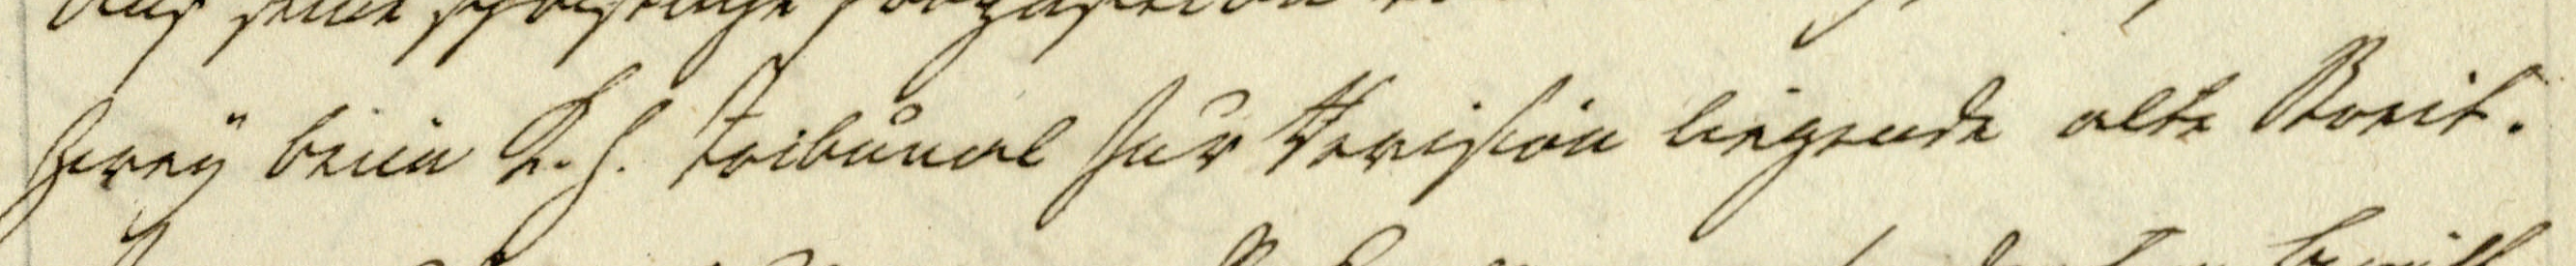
zweÿ beim K. h. Tribunal zur Revision liegende alte Streit¬
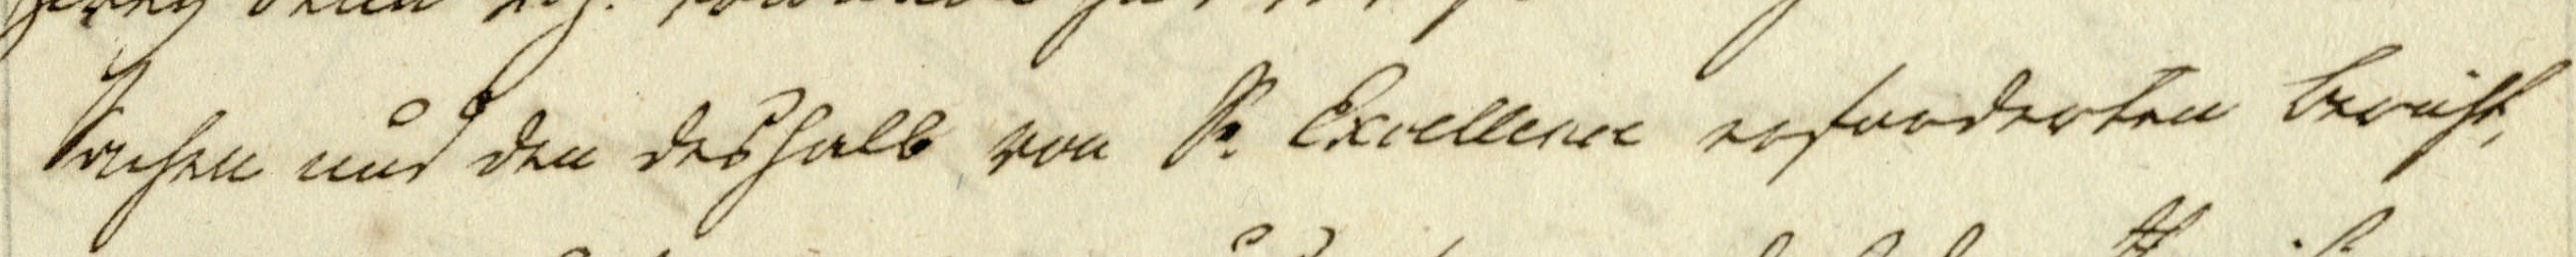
Sachen und den deshalb von Sr. Excellence erforderten Bericht,
